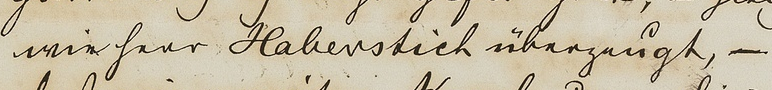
wie Herr Haberstich überzeugt, –
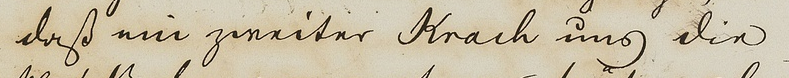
daß ein zweiter Krach uns die
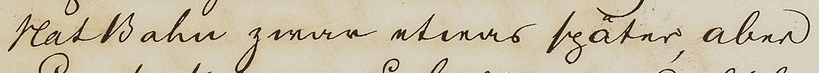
NatBahn zwar etwas später, aber
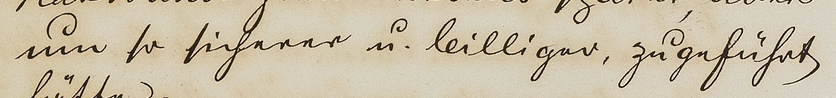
um so sicherer u. billiger, zugeführt
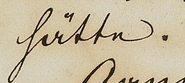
hätte.
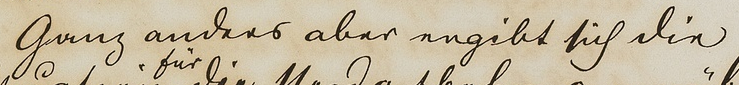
Ganz anders aber ergibt sich die
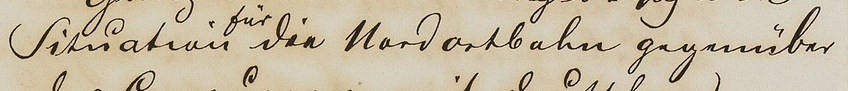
Situation für die Nordostbahn gegenüber
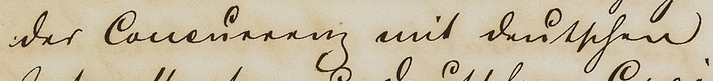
der Concurrenz mit deutschen
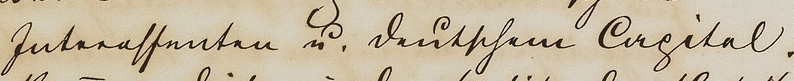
Interessenten u. deutschem Capital.
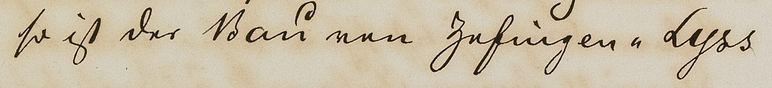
so ist der Bau von Zofingen –Lyss
